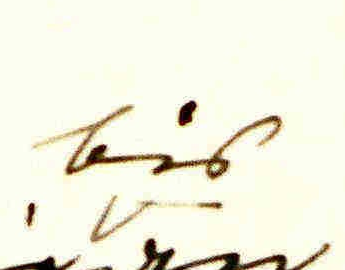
bis
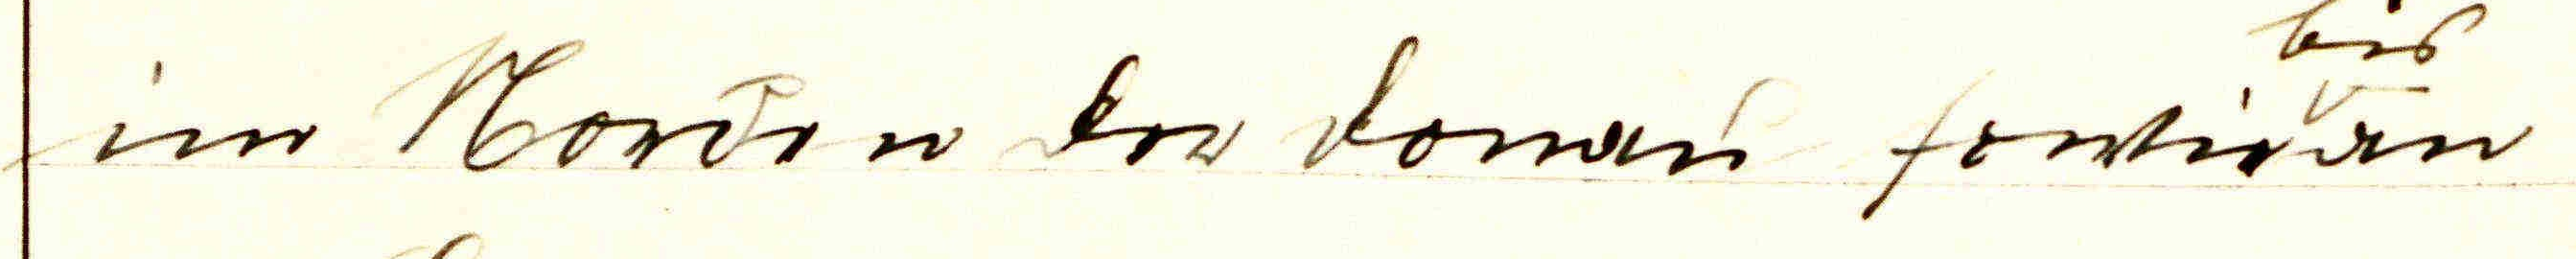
im Norden der Donau sowie an
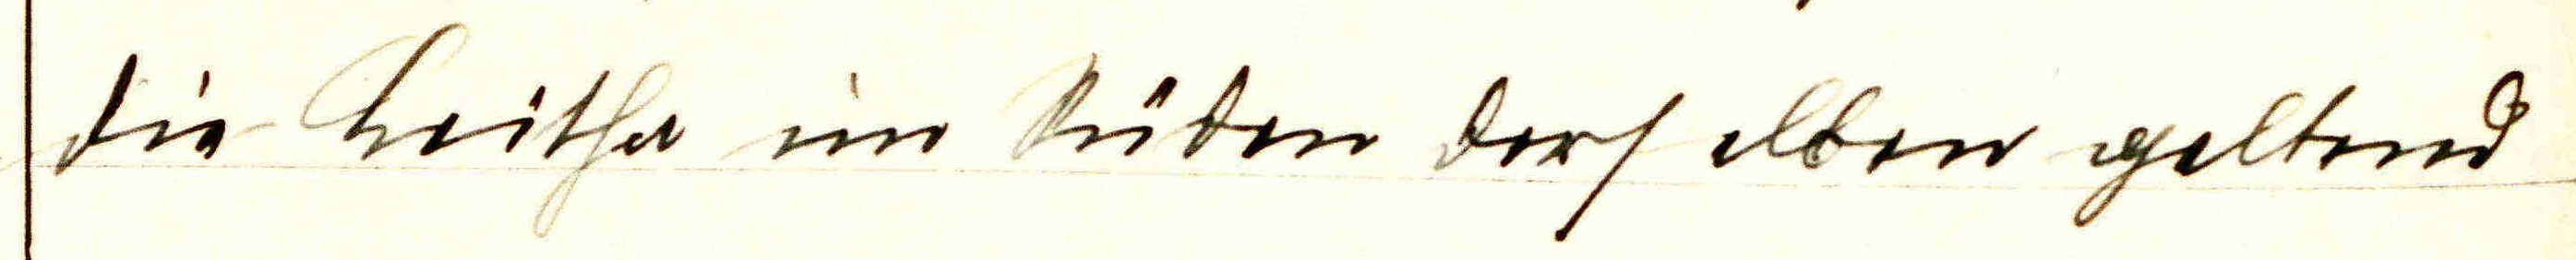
die Leitha im Süden derselben geltend
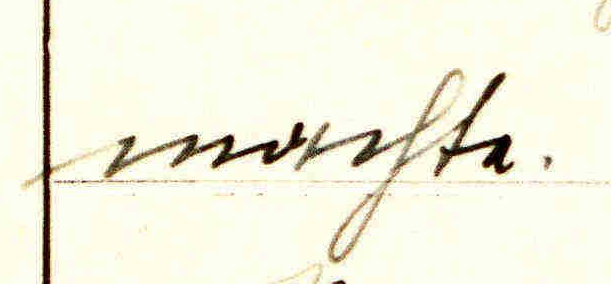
machte.
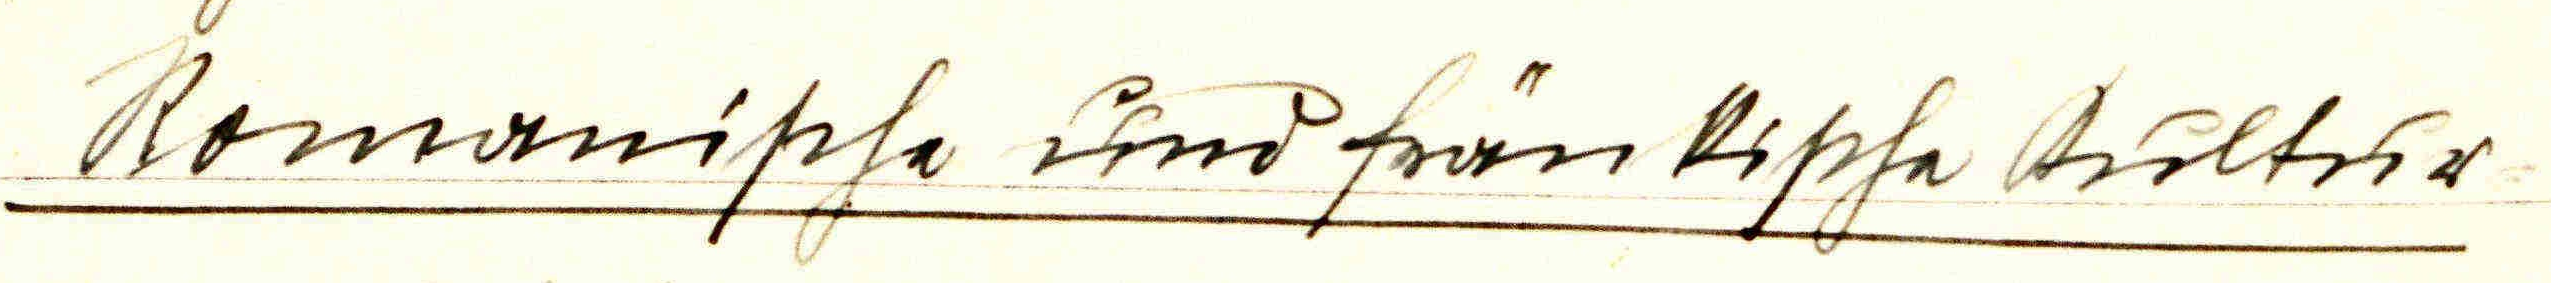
Romanische und fränkische Kultur-
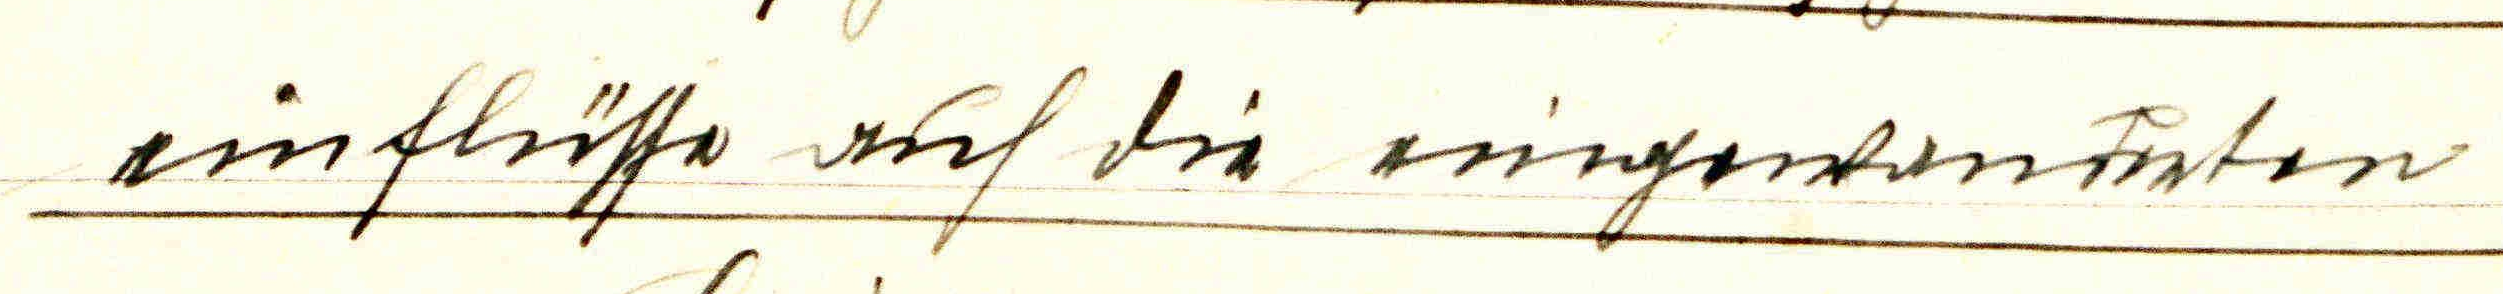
einflüsse auf die eingewanderten
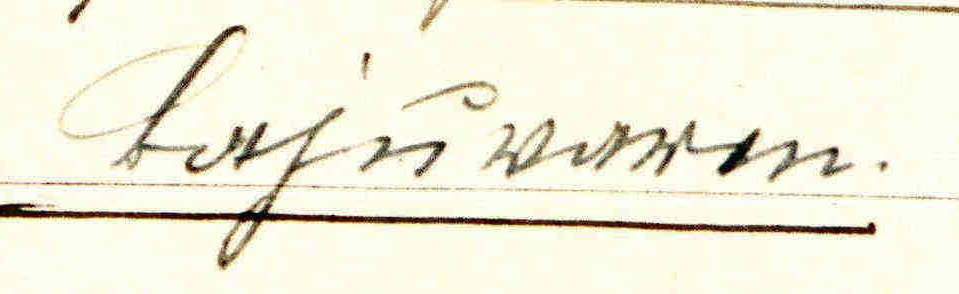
Bajuwaren.
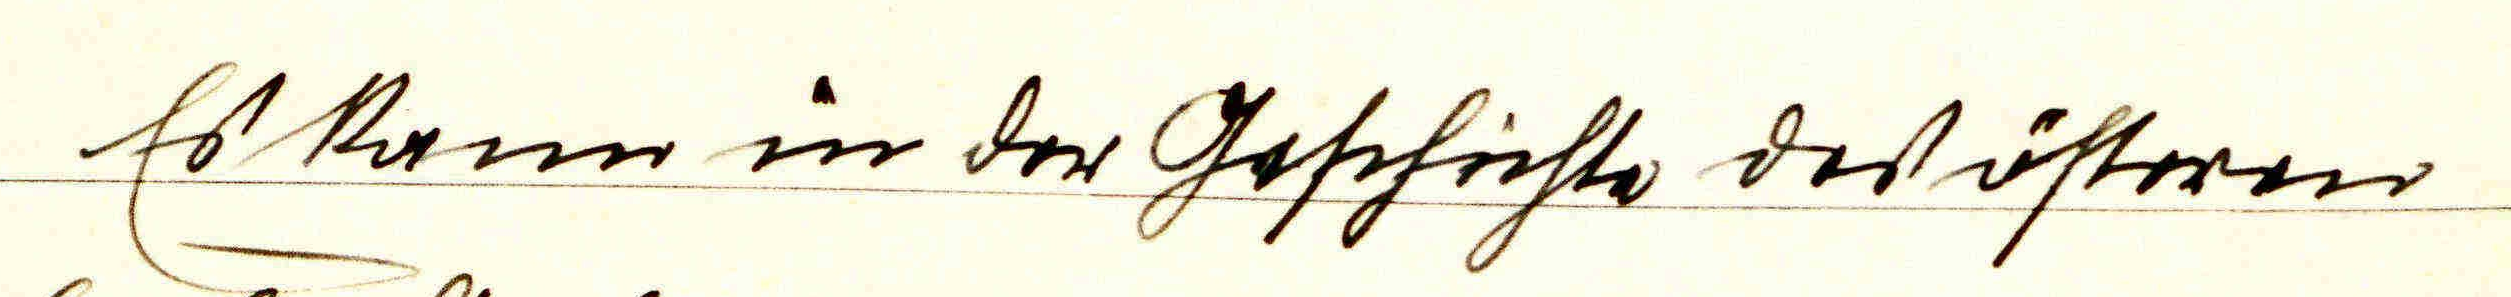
Es kam in der Geschichte des öfteren
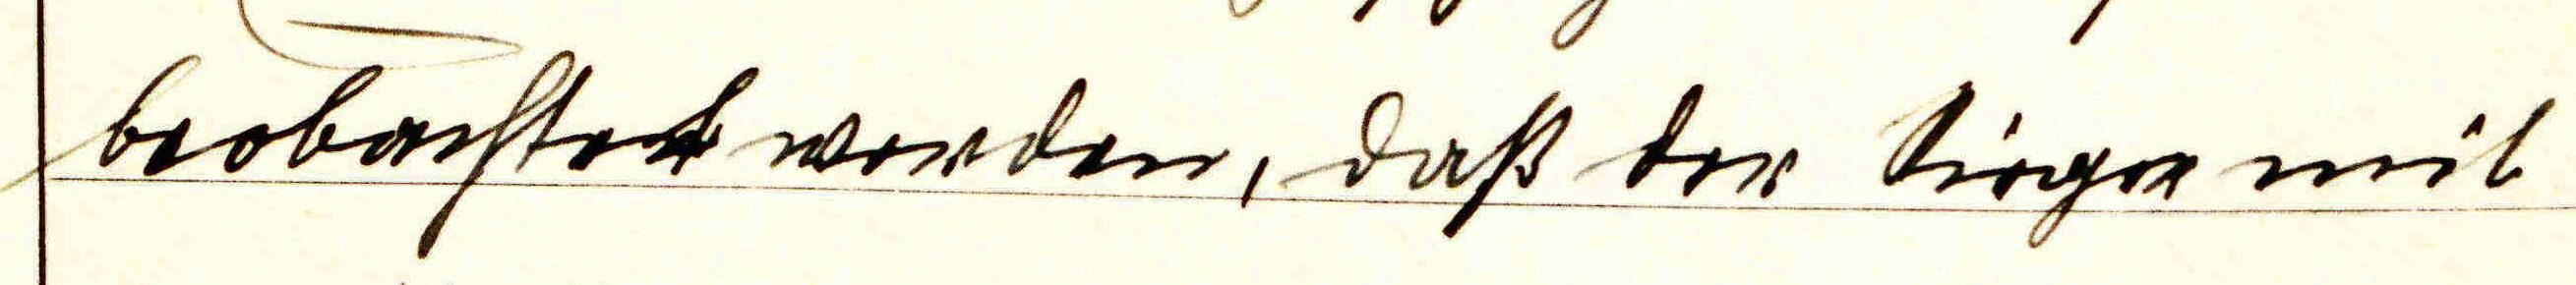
beobachtet werden, daß der Sieger mit
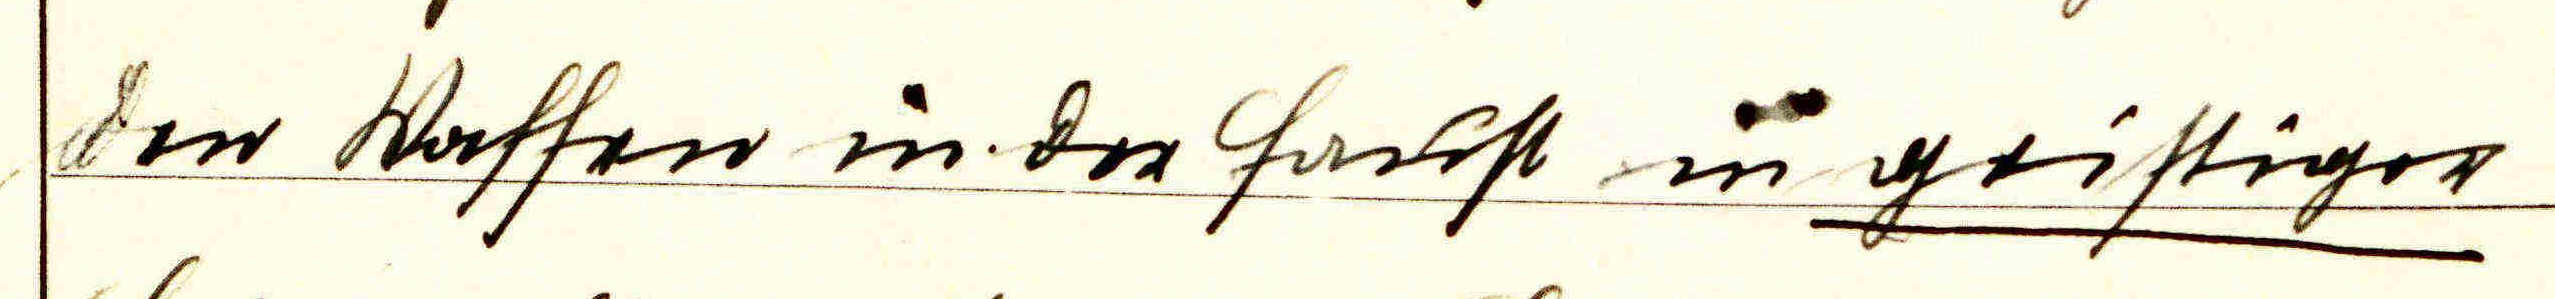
den Waffen in der Faust in geistiger
